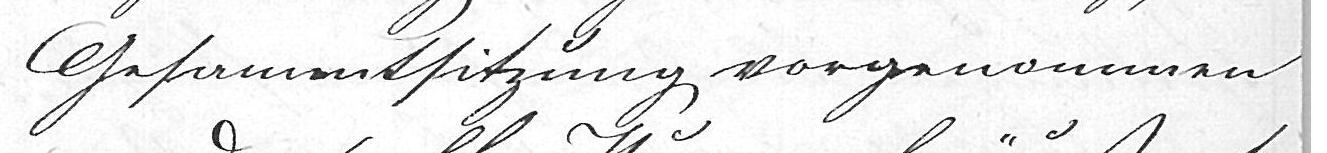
Gesammtsitzung vorgenommen
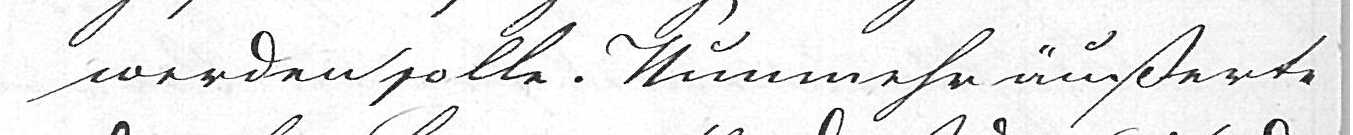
werden solle. Nunmehr äußerte
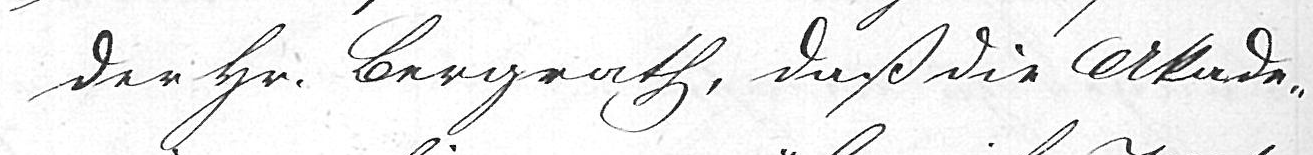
der Hr. Bergrath, daß die Akade-
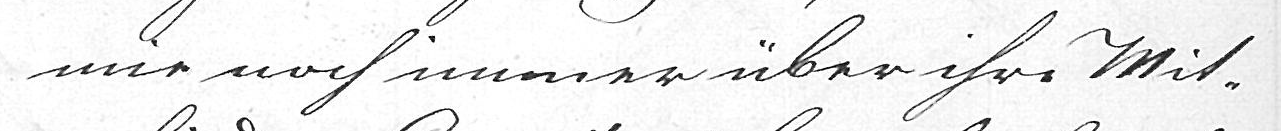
mie noch immer über ihre Mit-
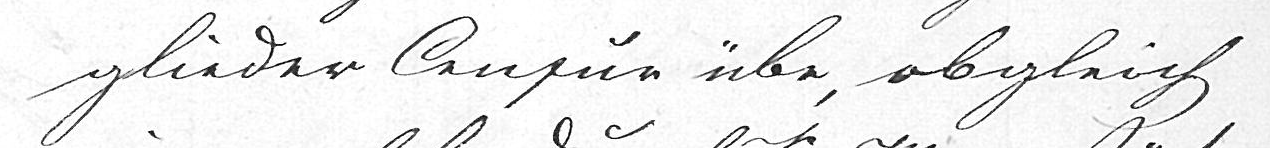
glieder Censur übe, obgleich
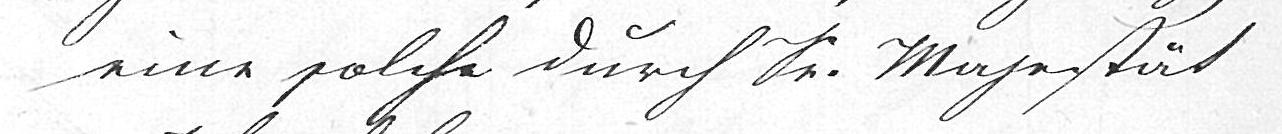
eine solche durch Sr. Majestät
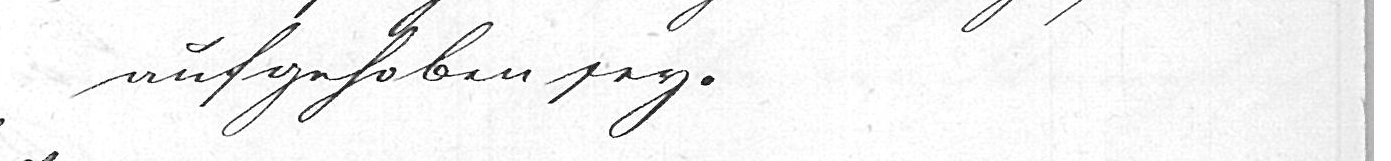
aufgehoben sey.
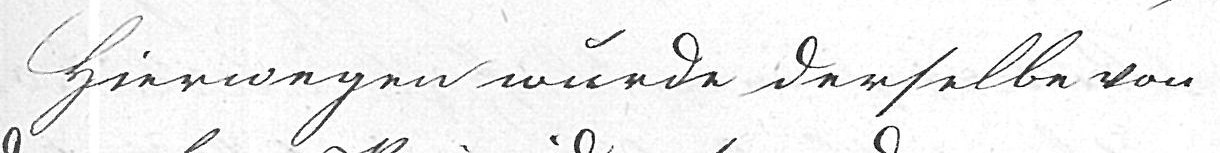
Hierwegen wurde derselbe von
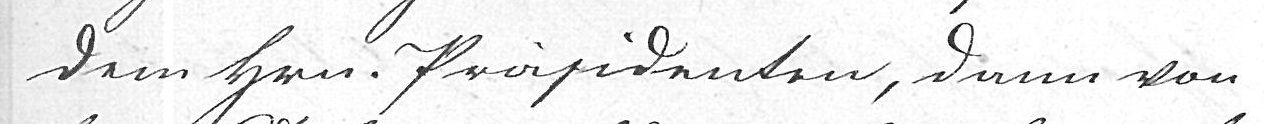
den Hrn. Präsidenten, dann von
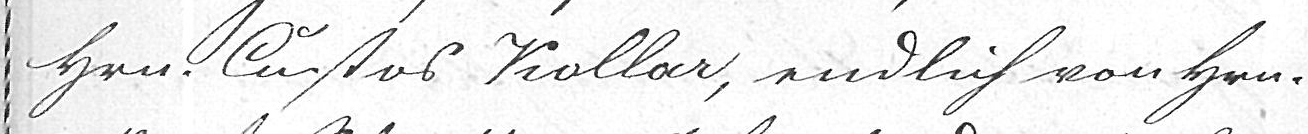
Hre. Custos Kollar, endlich von Hrn.
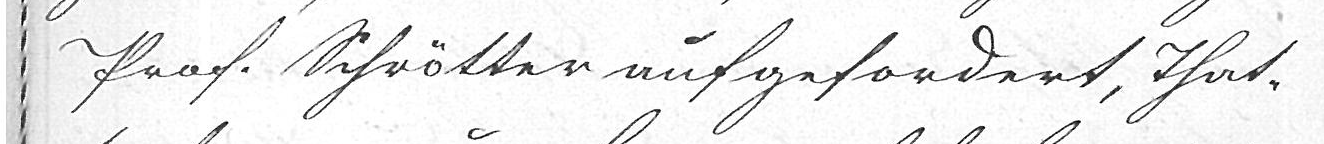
Prof. Schrötter aufgefordert, That-
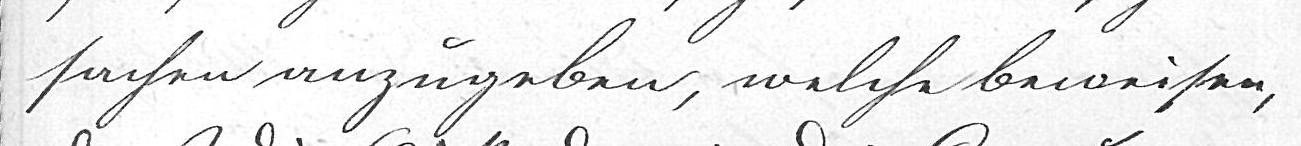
sachen anzugeben, welche beweisen,
